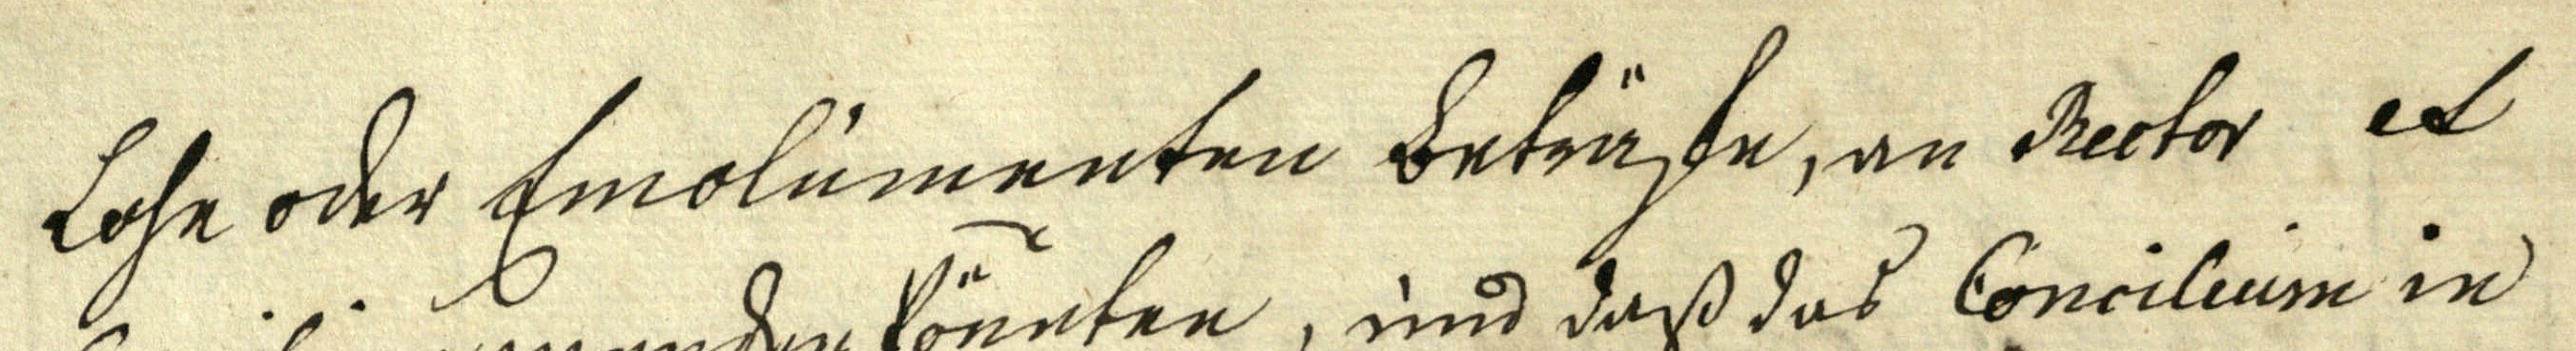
Lohn oder Emolumenten beträfe, an Rector et
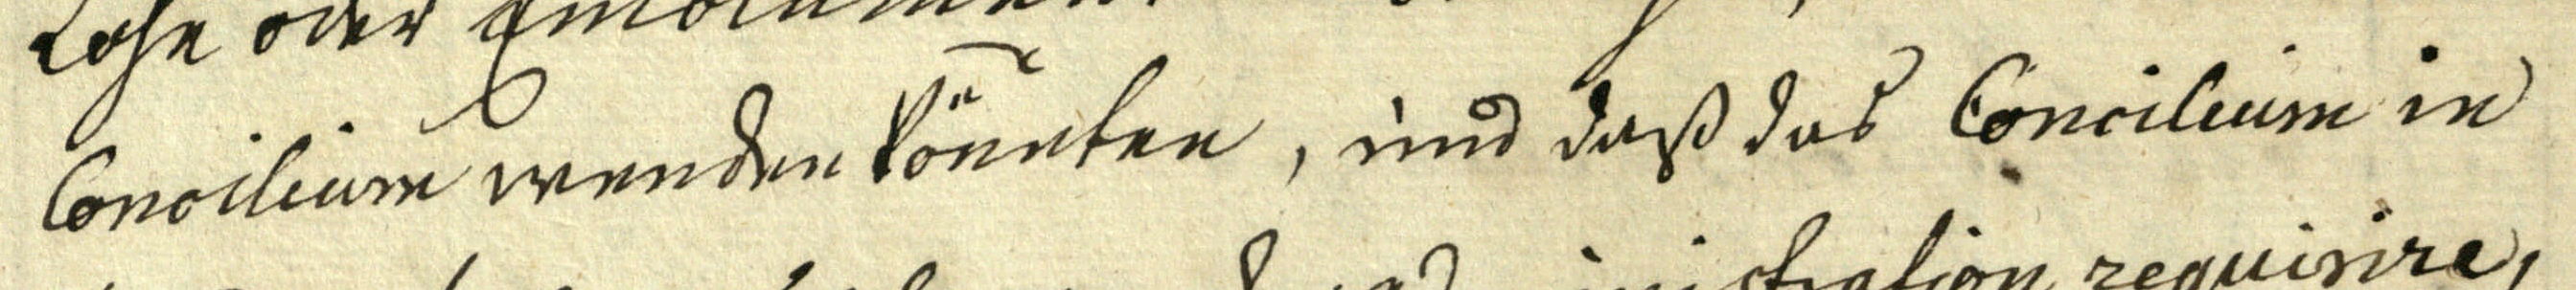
Concilium wenden könnten, und daß das Concilium in
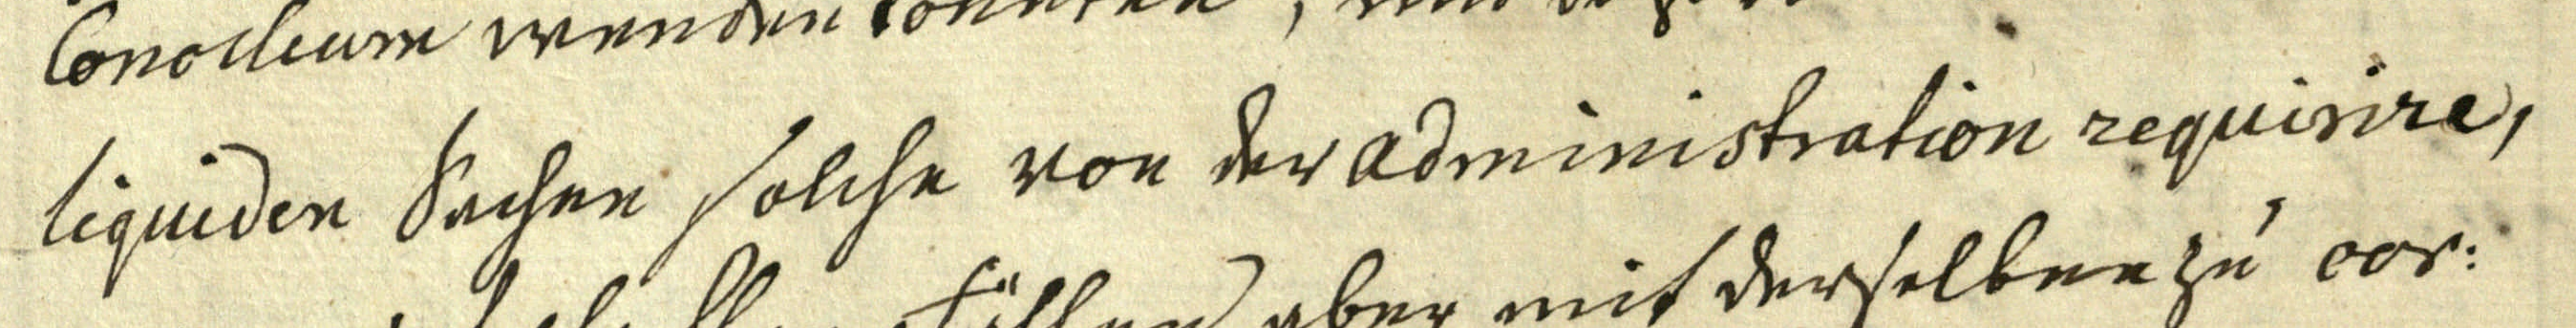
liquiden Sachen solche von der Administration requirire,
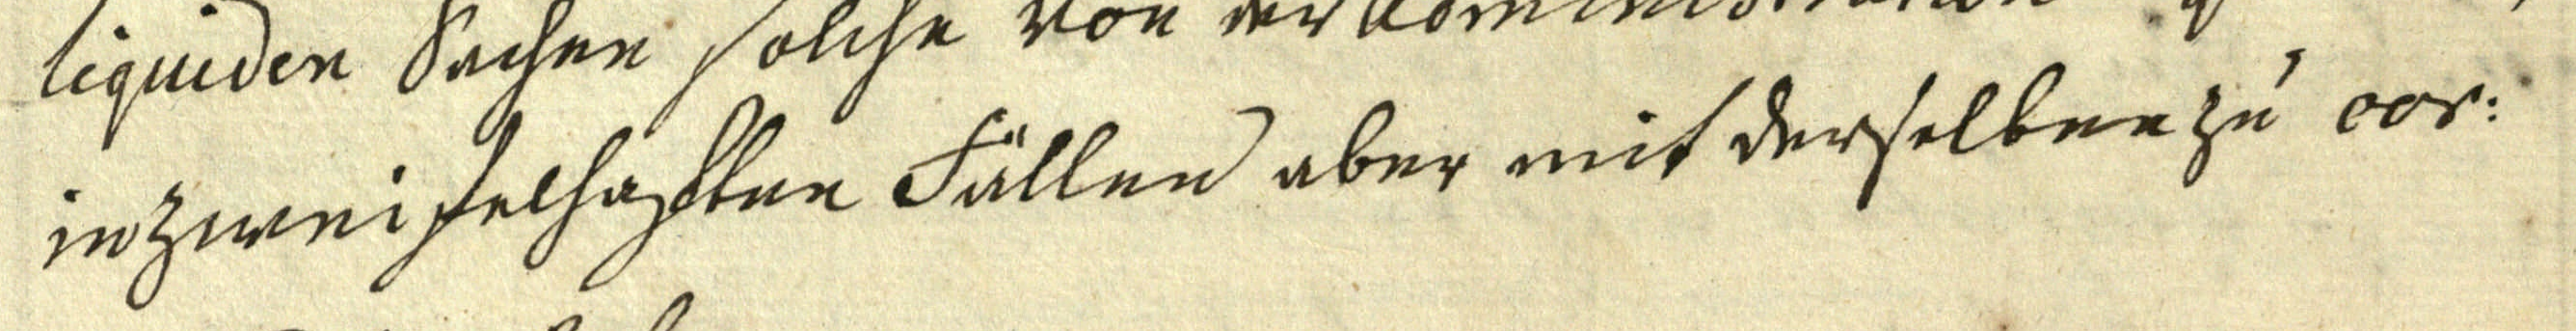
in zweifelhaften Fällen aber mit derselben zu cor¬
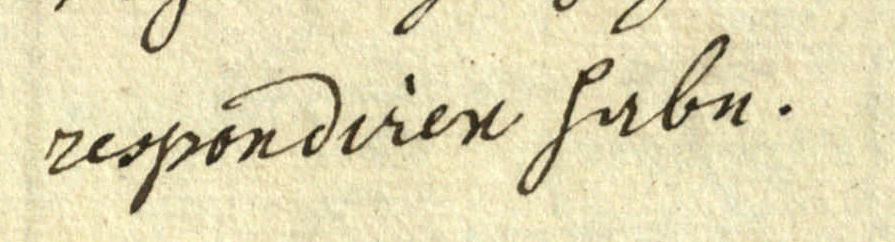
respondiren habe.
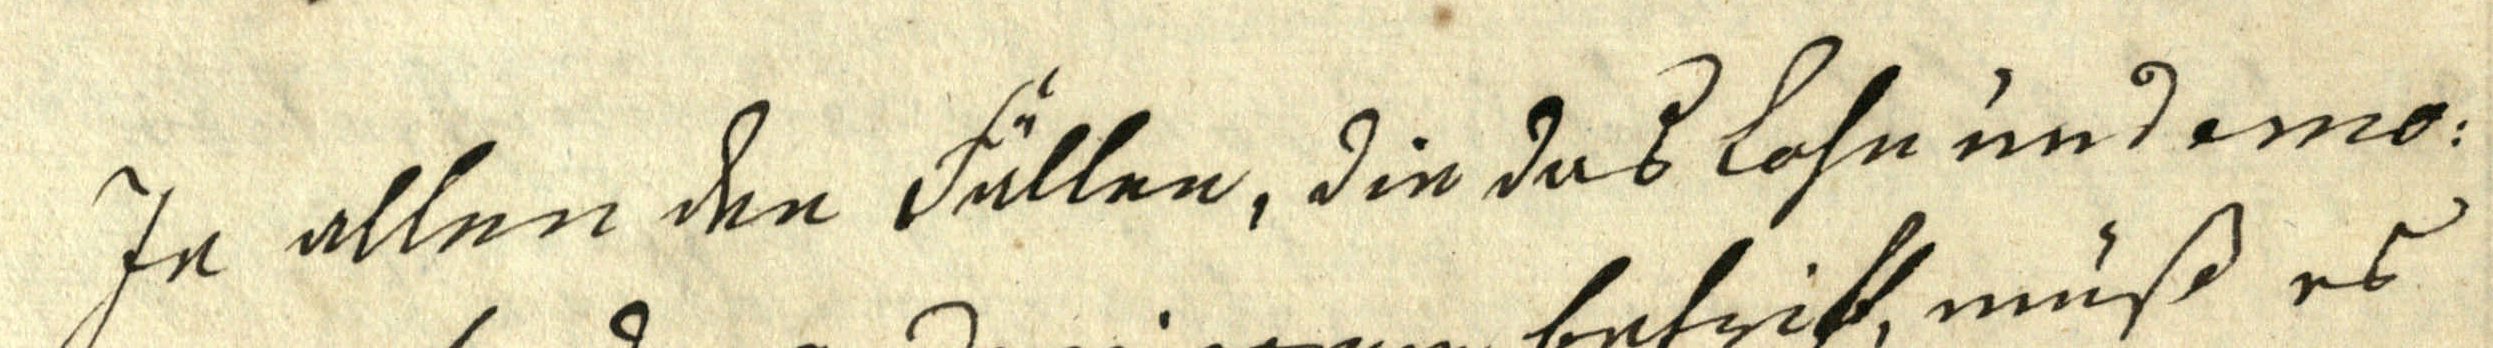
In allen den Fällen, die das Lohn und emo¬
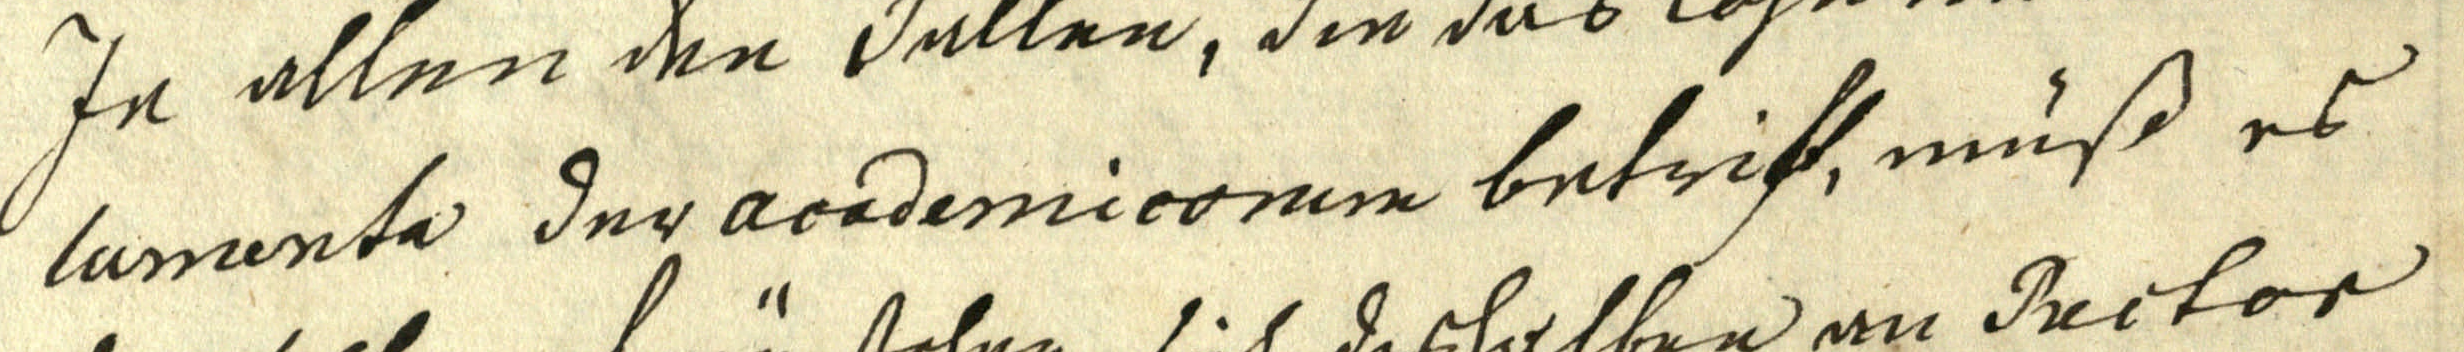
lumenta der Academicorum betrift, muß es
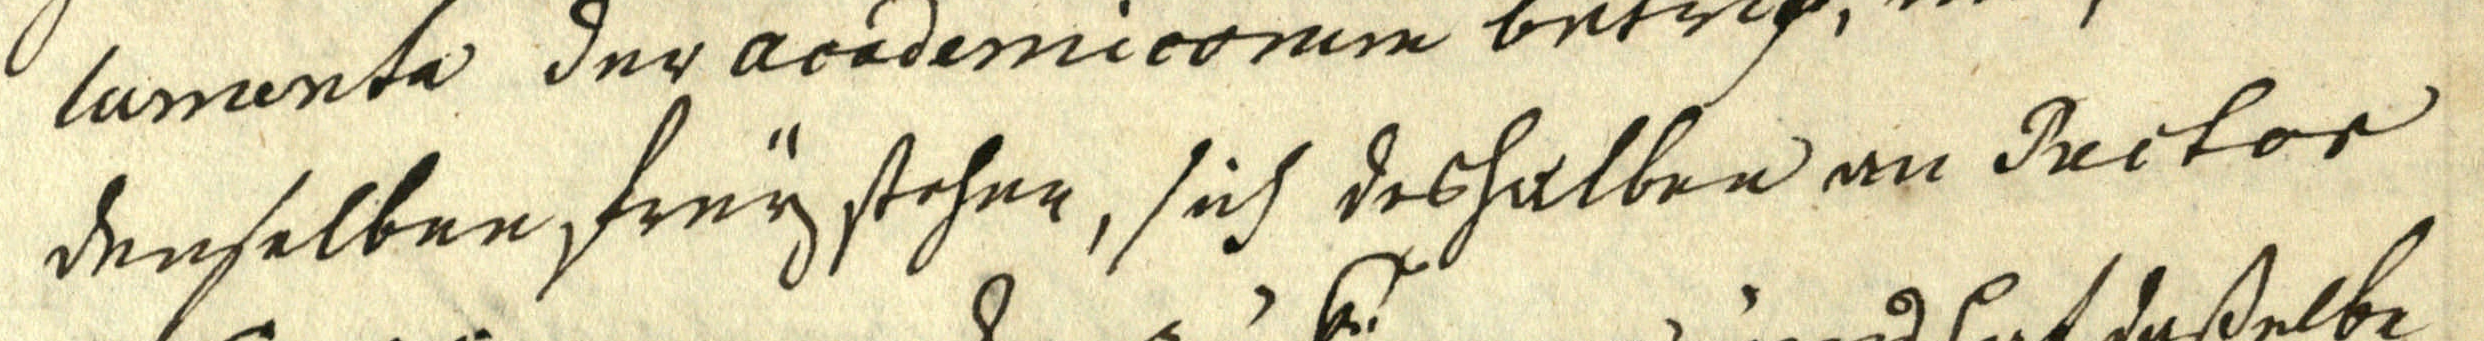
denselben freÿ stehen, sich deshalben an Rector
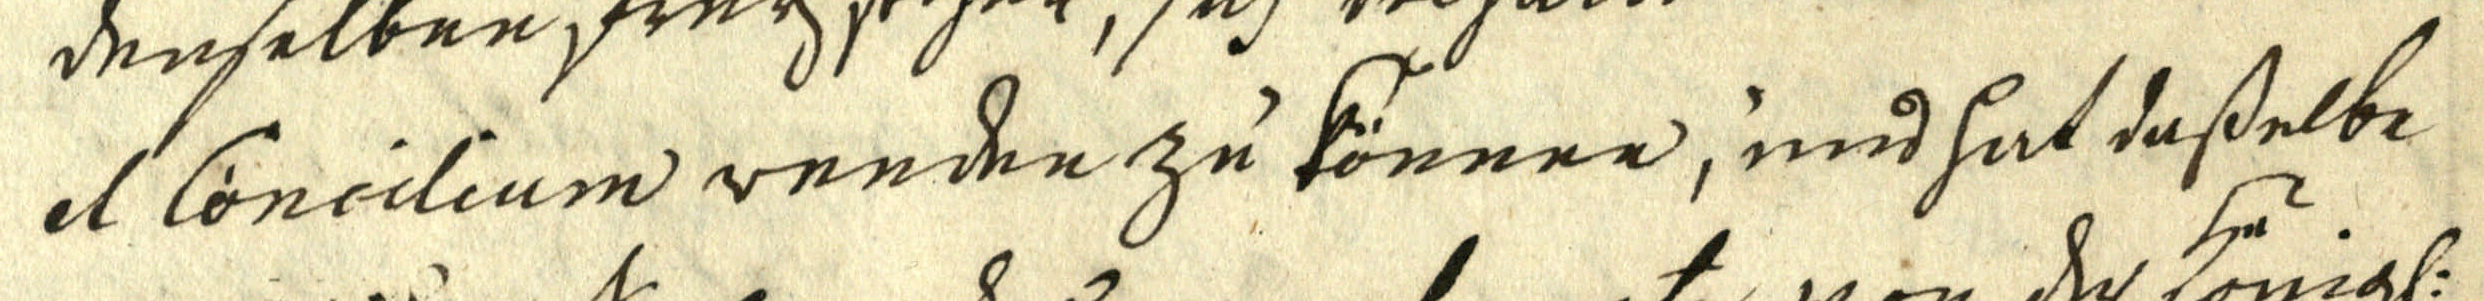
et Concilium wenden zu können, und hat daßelbe
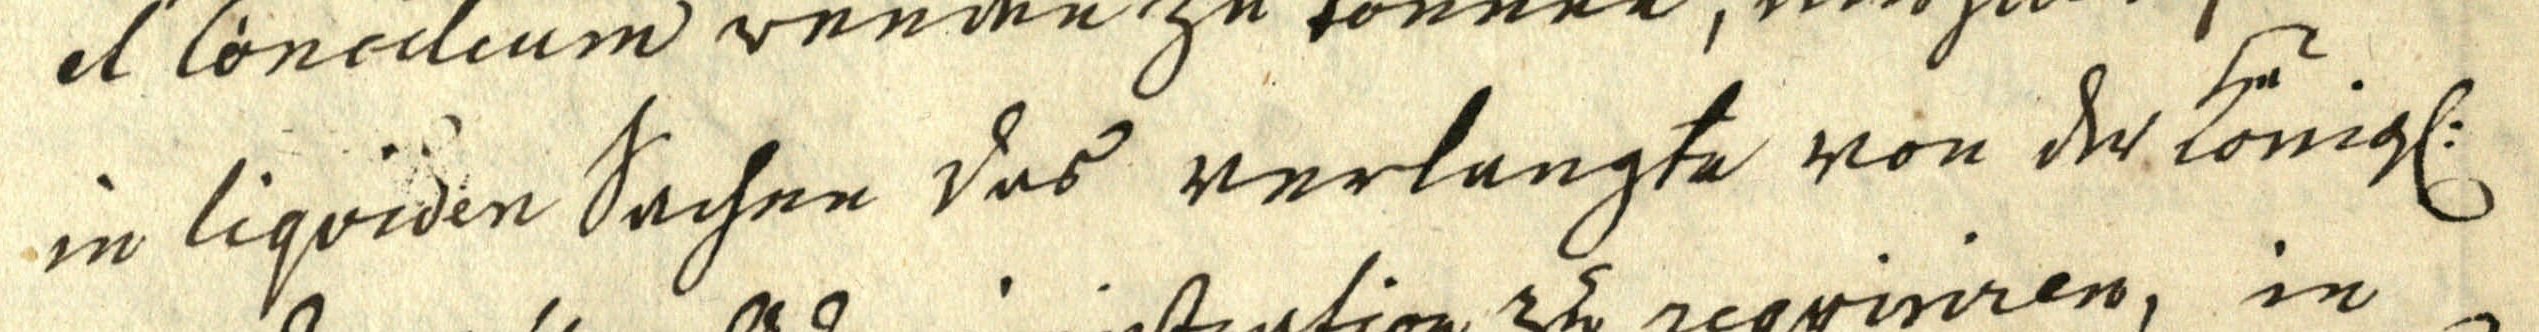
in liquiden Sachen das verlangte von der Königl.
